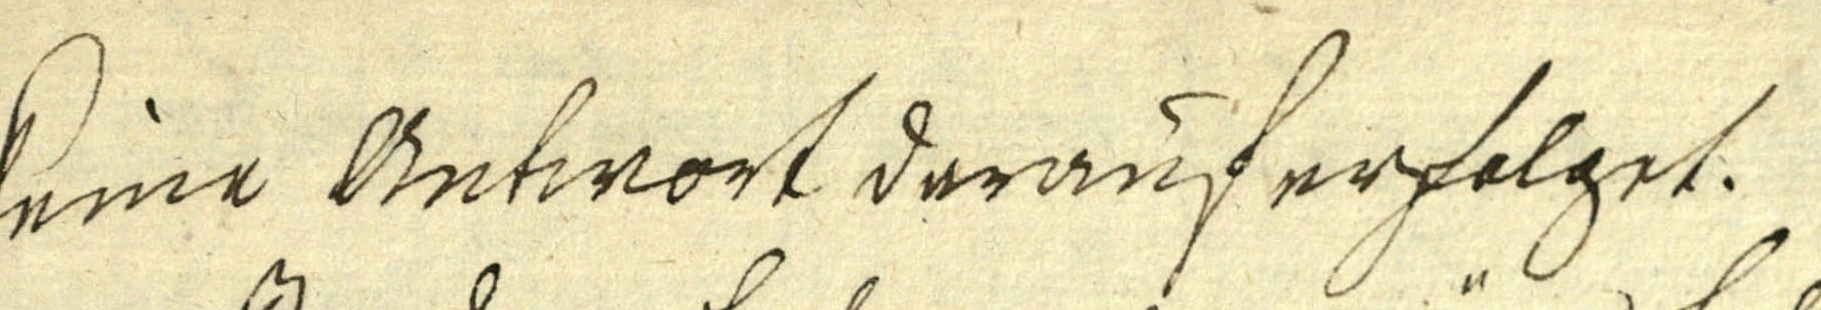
keine Antwort darauf erfolget.
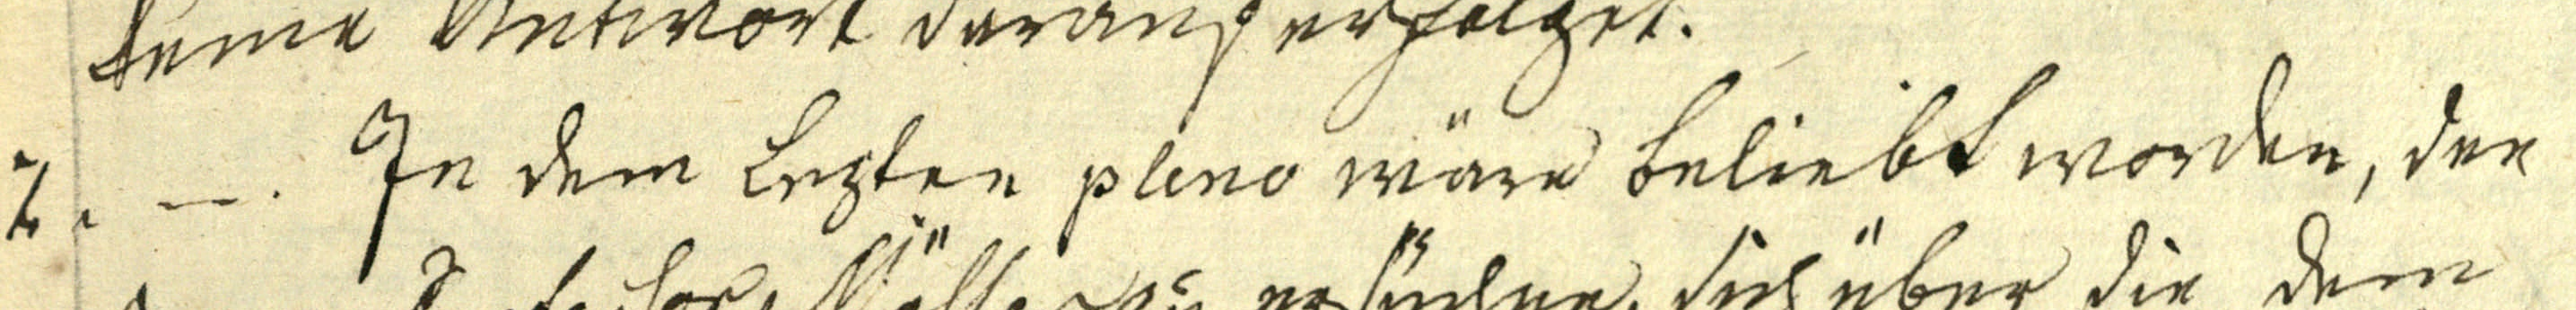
1. In dem lezten pleno wäre beliebt worden, den
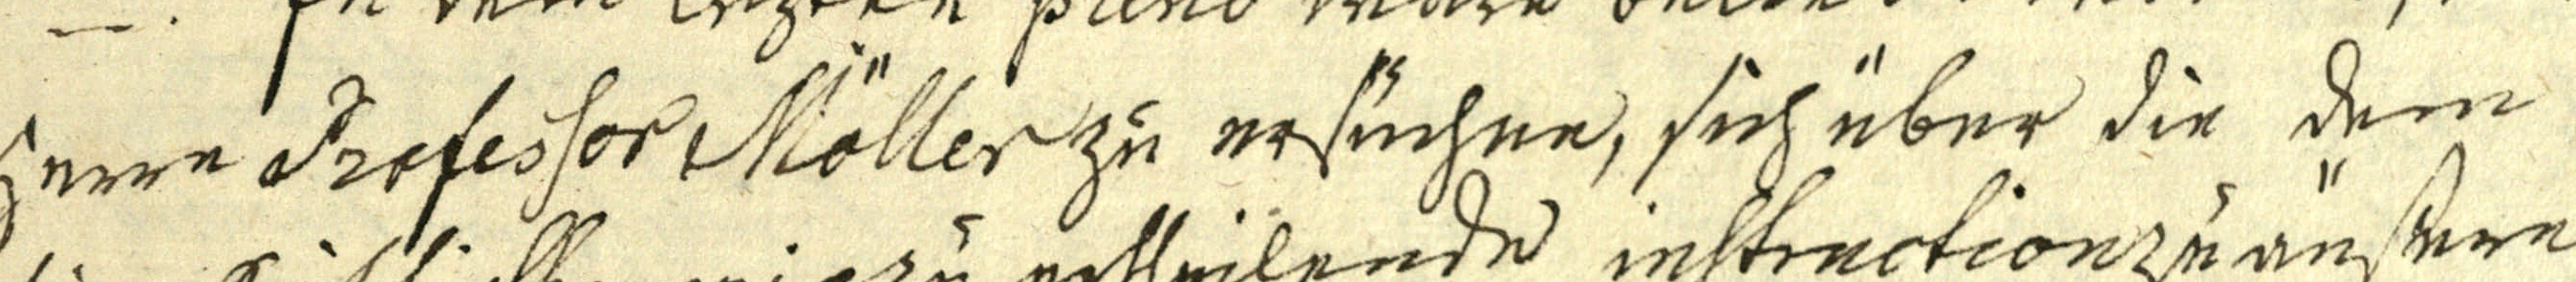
Herrn Professor Möller zu ersuchen, sich über die dem
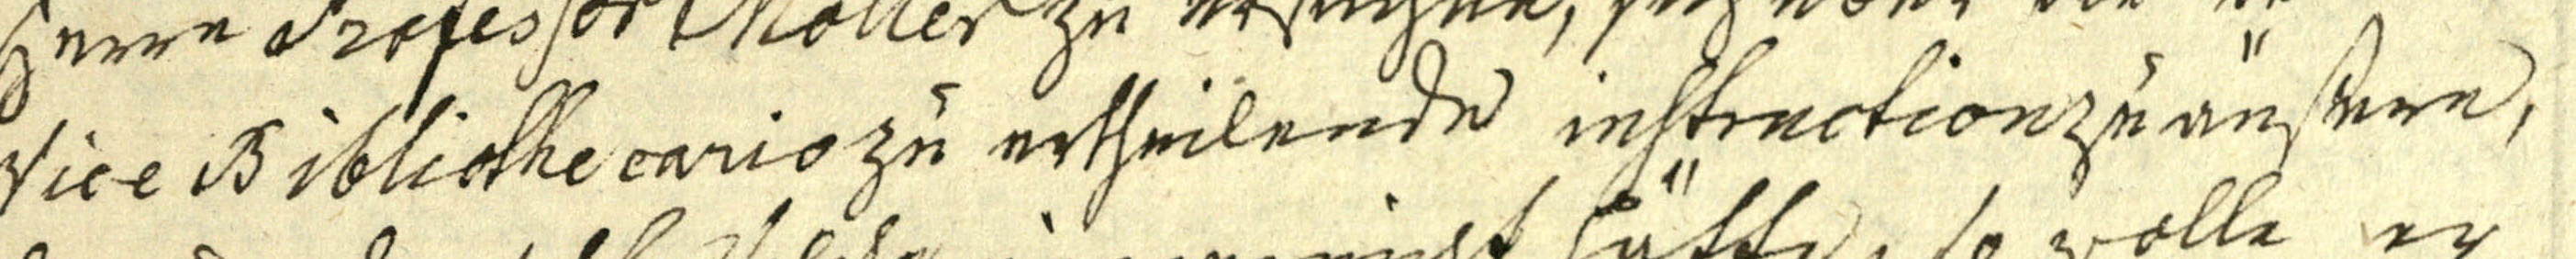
Vice Bibliothecario zu ertheilenden instruction zu äußern,
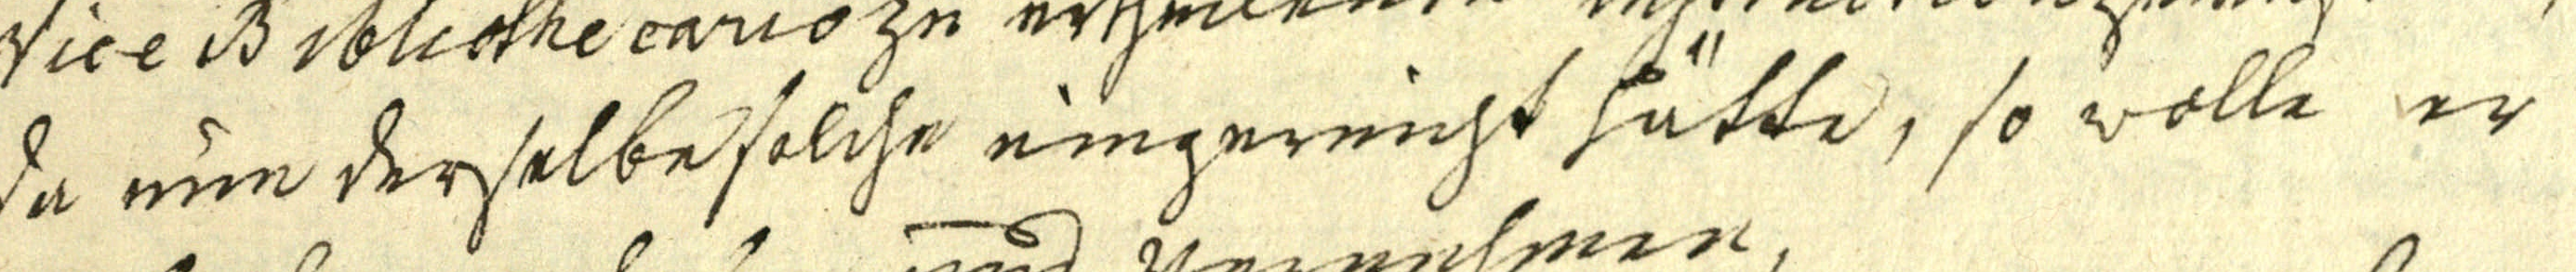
da nun derselbe solche eingereicht hätte, so wolle er
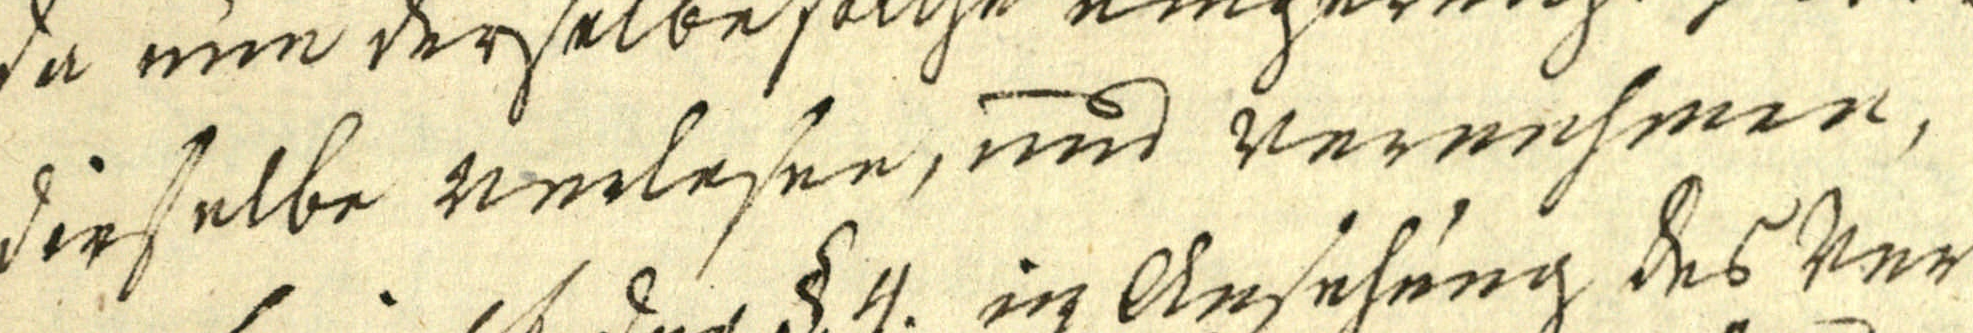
dieselbe verlesen, und vernehmen,
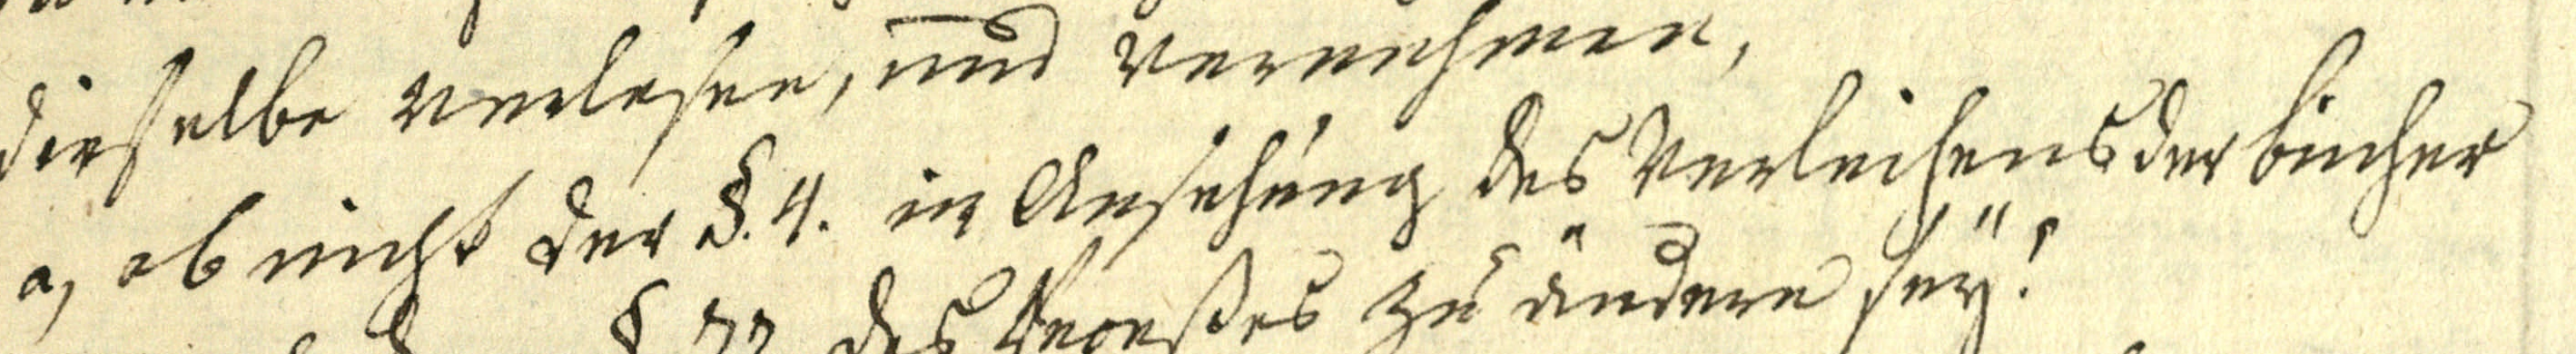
a, ob nicht der § 4. in Ansehung des Verleihens der Bücher
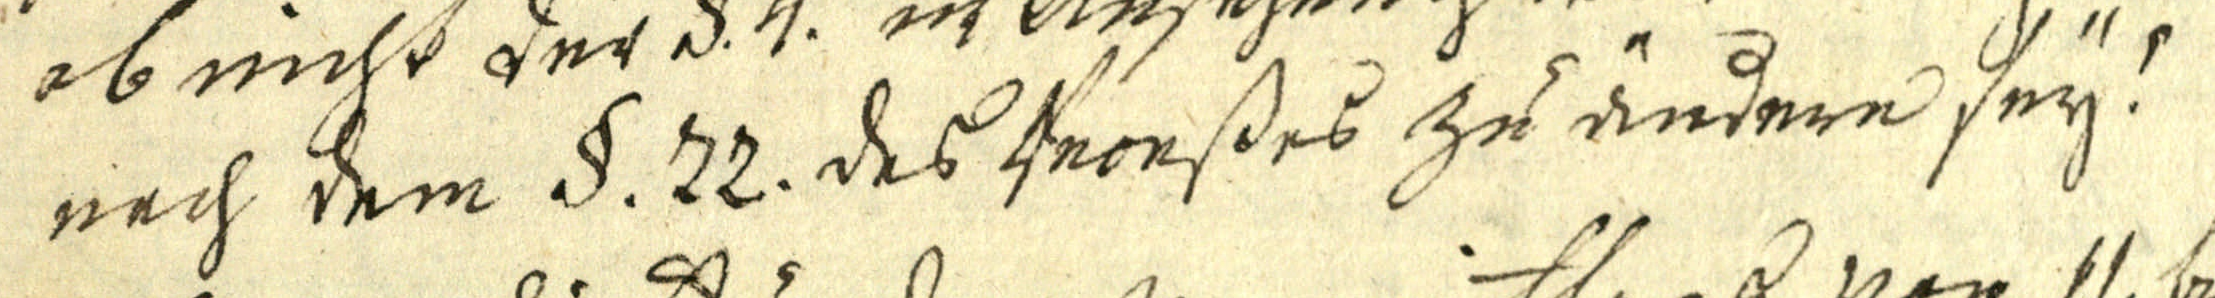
nach dem § 22. des Receßes zu ändern seÿ?
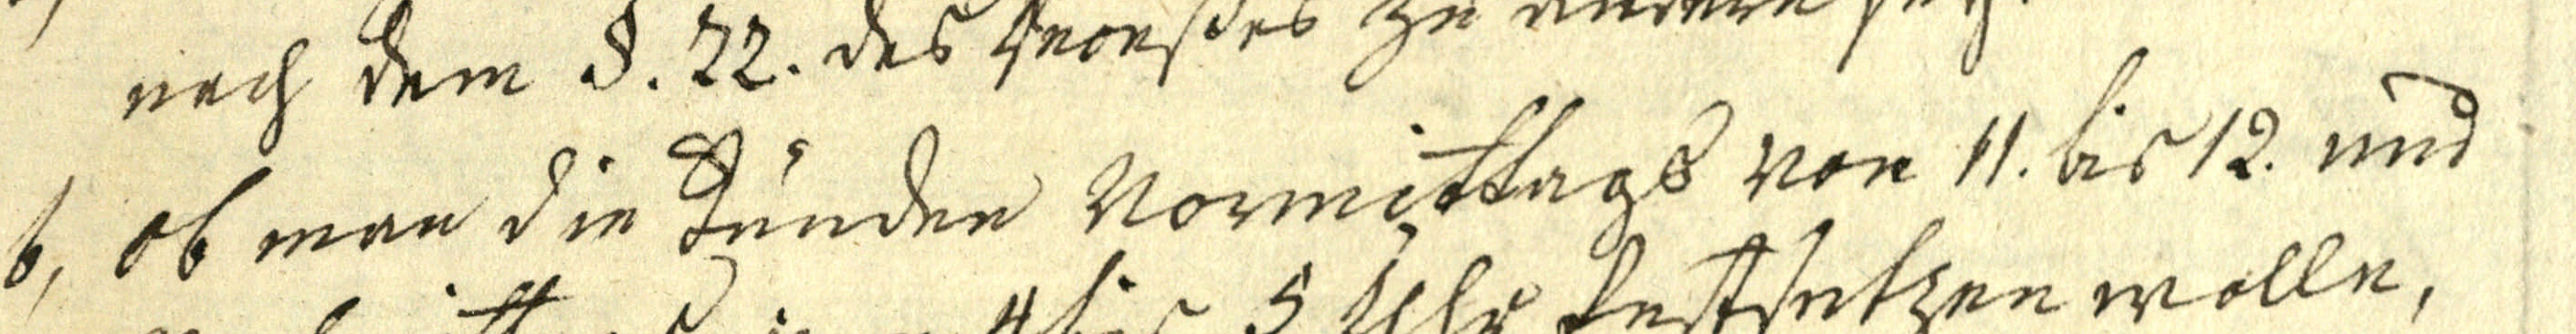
b, ob man die Stunden Vormittags von 11. bis 12. und
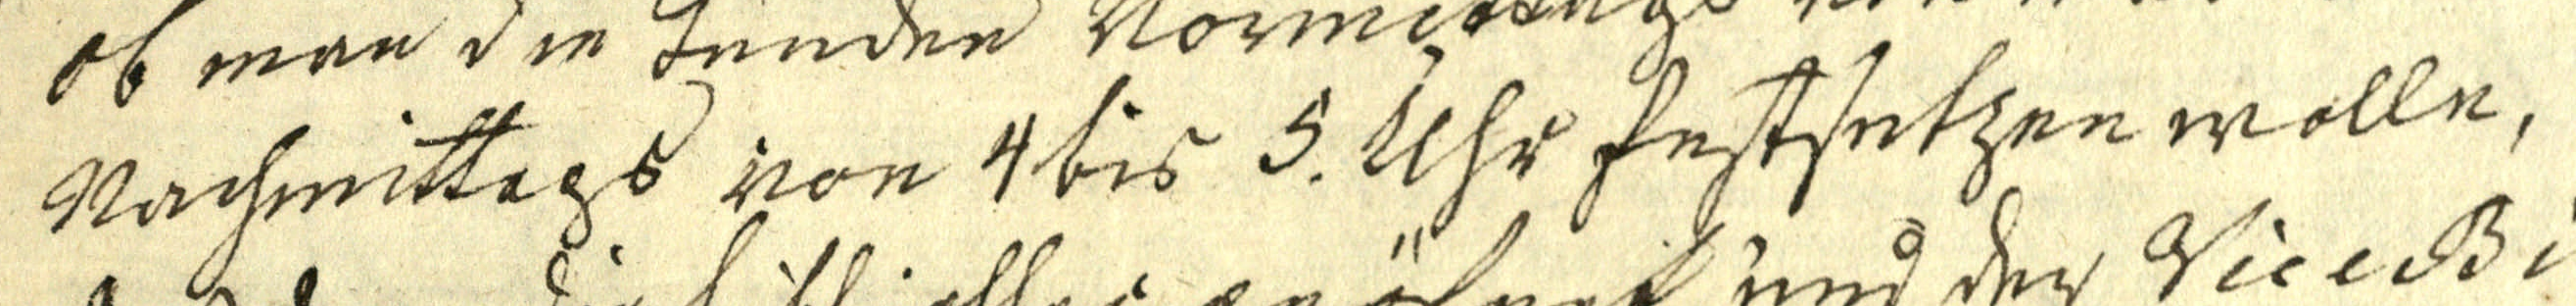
Nachmittags von 4 bis 5. Uhr festsetzen wolle,
